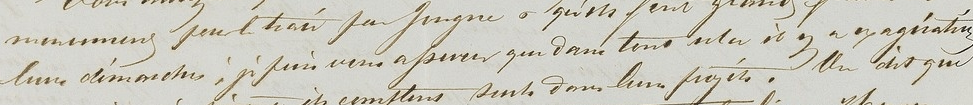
leurs démarches; je puis vous assurer, que dans tout cela il y a exagération
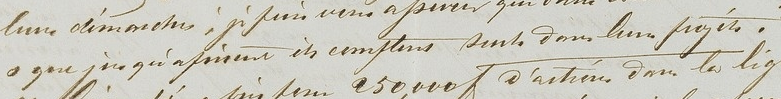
& que jusqu'aprésent ils comptent tort dans leurs projets.
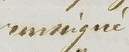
renseigné.
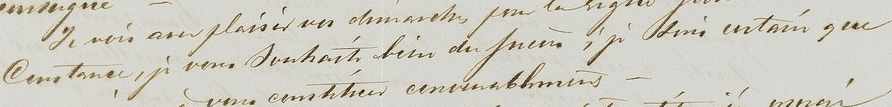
Constance, je vous souhaite bien du succès, je suis certain que
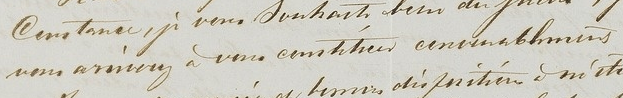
vous arriverez à vous constituer convenablement.
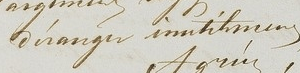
déranger inutilement.
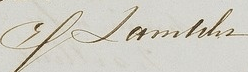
F Lambelet
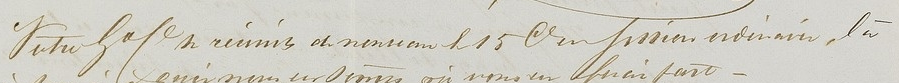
Notre Gr Cl se réunit de nouveau le 15 Ct en session ordinaire, là
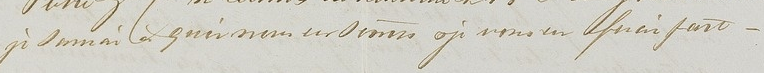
je saurai à quoi nous nous en sommes & je vous en ferai part.
